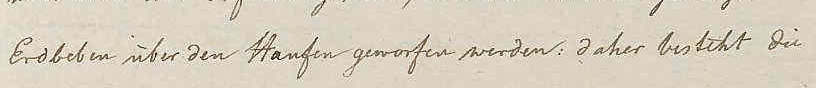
Erdbeben über den Haufen geworfen werden: daher besteht die
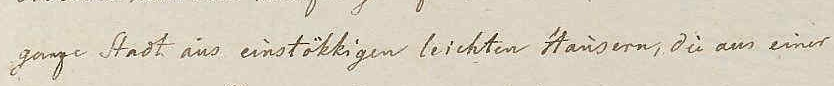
ganze Stadt aus einstökkigen leichten Häusern, die aus einer
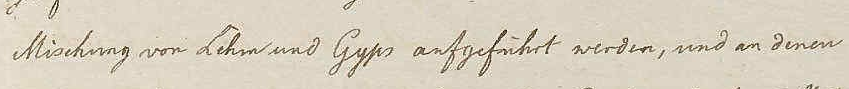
Mischung von Lehm und Gyps aufgeführt werden, und an denen
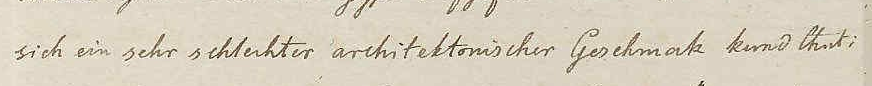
sich ein sehr schlechter architektonischer Geschmak kund thut;
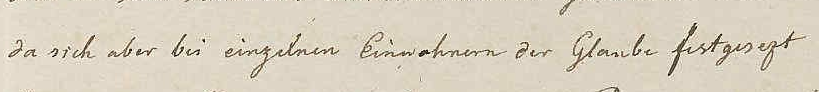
da sich aber bei einzelnen Einwohnern der Glaube festgesezt
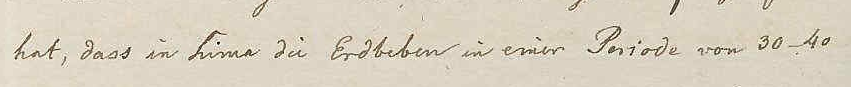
hat, dass in Lima die Erdbeben in einer Periode von 30-40
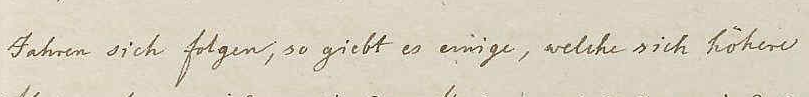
Jahren sich folgen, so giebt es einige, welche sich höhere
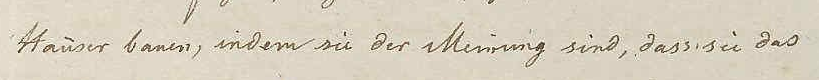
Häuser bauen, indem sie der Meinung sind, dass sie das
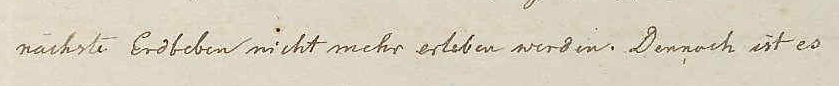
nächste Erdbeben nicht mehr erleben werden. Dennoch ist es
